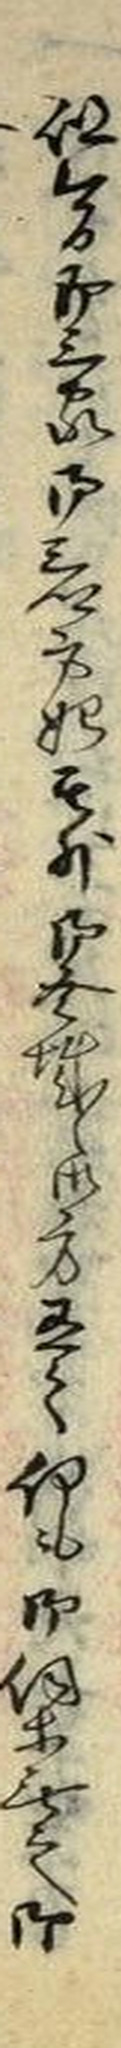但今日御三家御三卿方始其外御登城之御方有之何も御伺等無之御
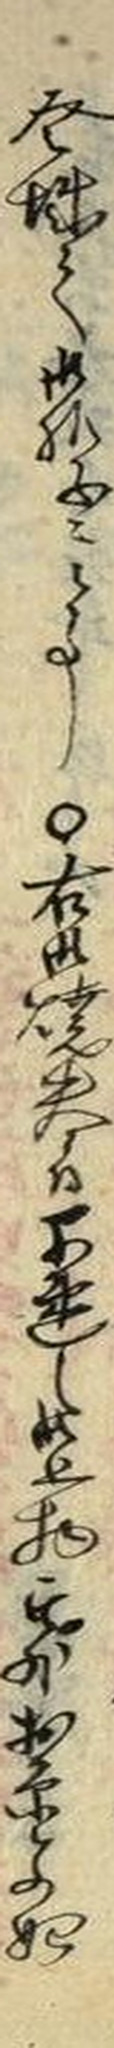登城之御様子ニ候事○右御焼失ニ付早速之御上物其外お糸との始

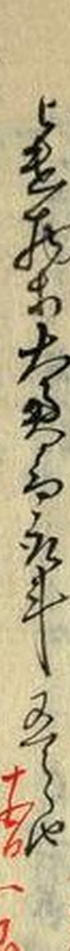被遣物等大奥ニ而取斗有之由
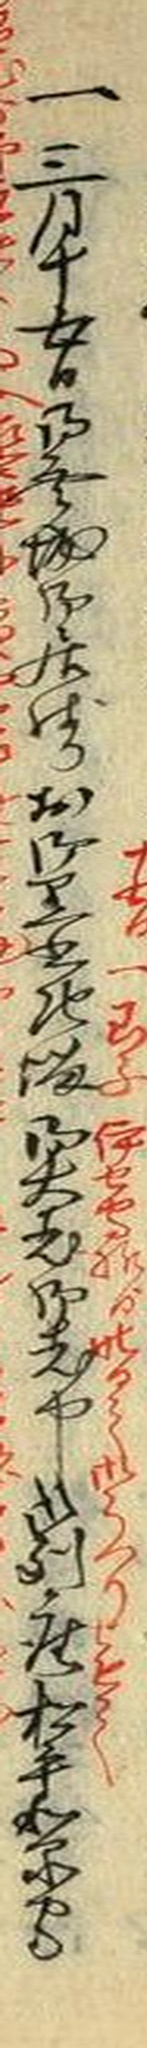一三月十五日御登城御居残り於御黒書院溜御大老御老中御列座松平和泉守
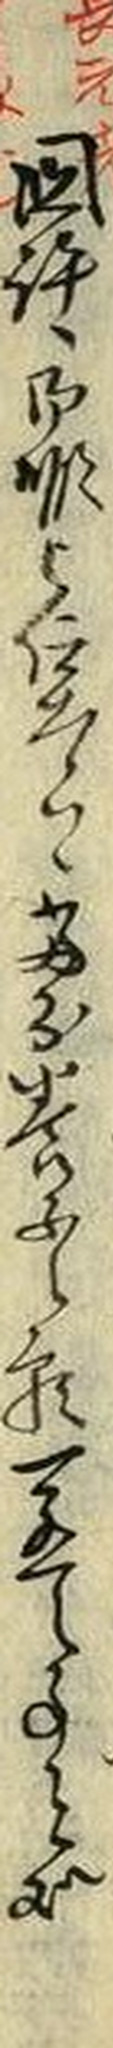「国許へ御暇被仰出候ハヽ当分養子之願可有之事ニ候処
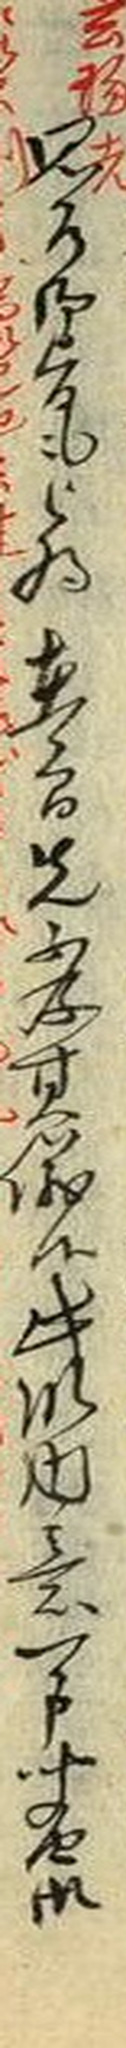思召御旨も被為在候間先不及其儀候此段内意可申聞由御
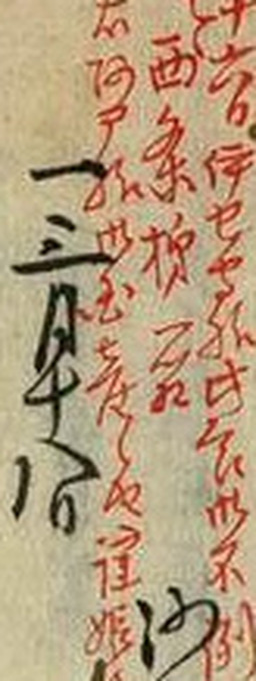一三月十八日
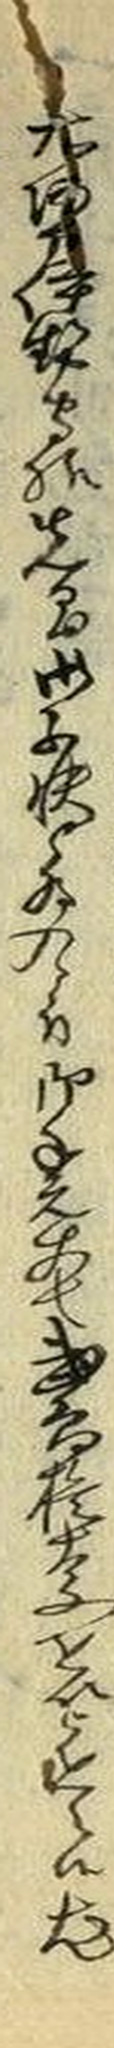右安部伊勢守様先日ゟ御不快為入候ニ付御手元使者武曽権太夫を以被進之候尤
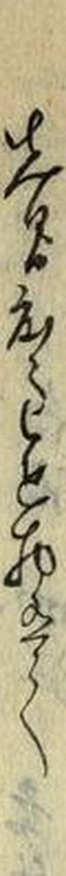先日ゟ度々被進物有之
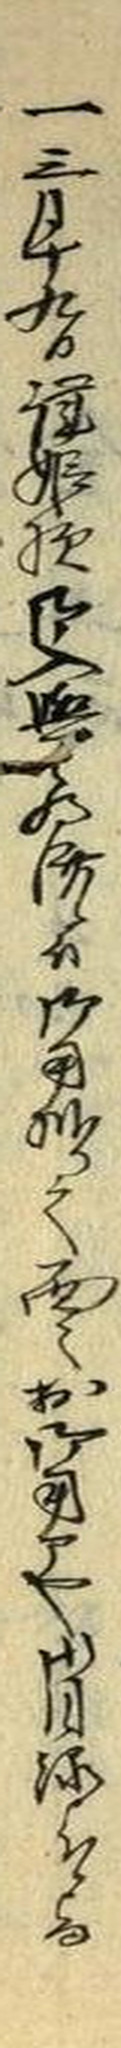一三月十九日謹姫様御入輿被為済候ニ付御用掛り之面々於御用部や御目録被下候旨
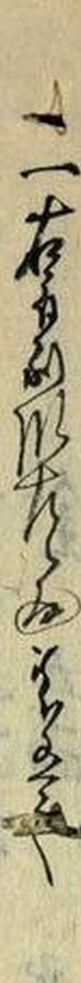一右ニ付別段左之通被下有之
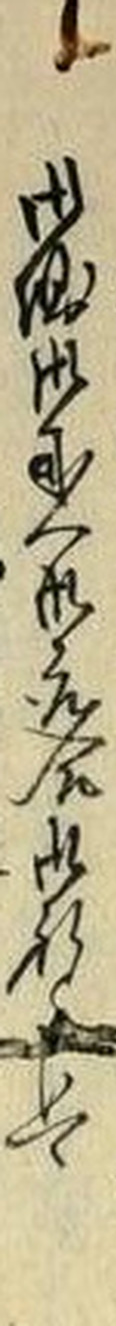御側御用人御取合御礼被申上候
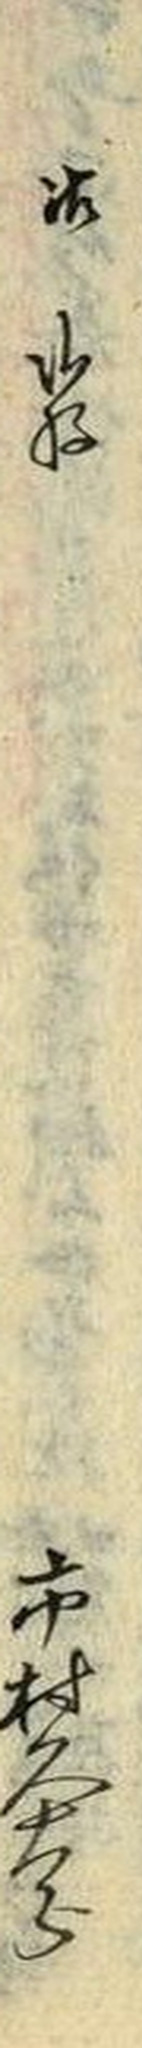銀弐枚市村久右衛門
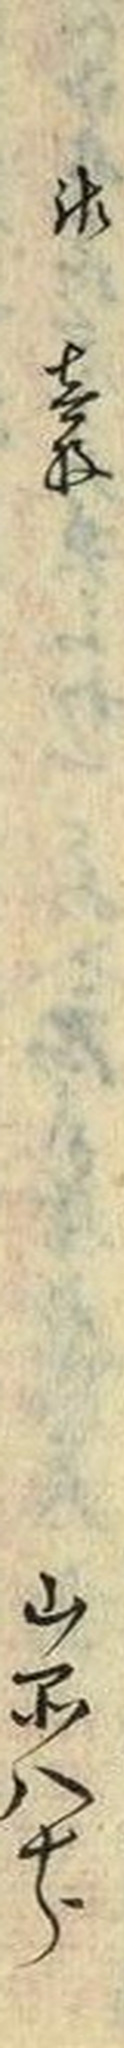銀壱枚山品八十郎
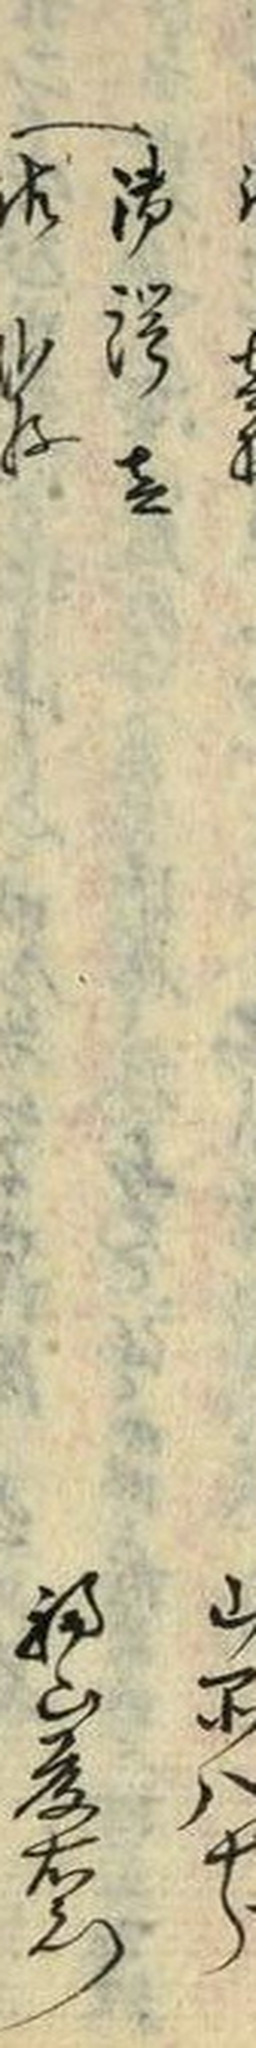銀弐枚市村久右衛門
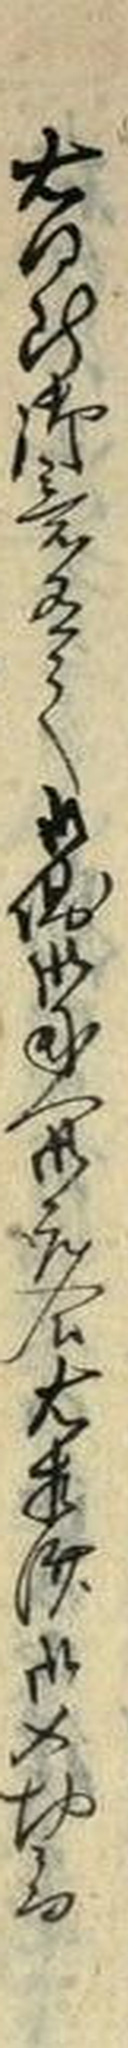右同断御意有之御側御用人御取合右相済御〆切ニ而
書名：少傅日録抄（斉善付側向頭取日記、江戸并道中、初入在国、逝去後…
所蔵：福井県文書館 Fukui Prefectural Archives
